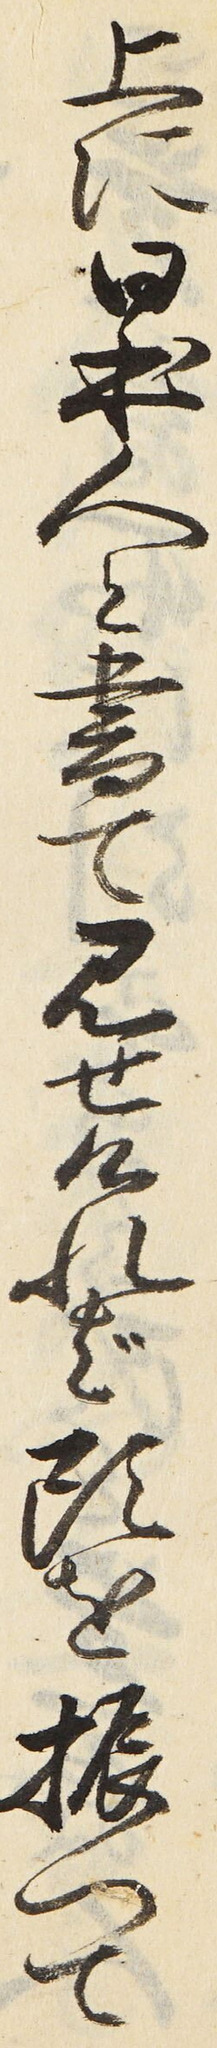上に日本人と書て見せければ頭を振つて
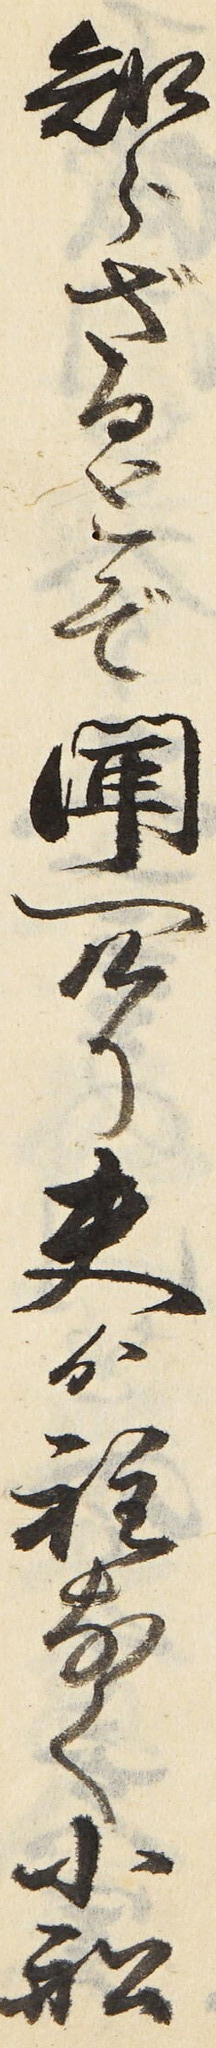知らざるとぞ聞へけり夫ゟ程なく小船
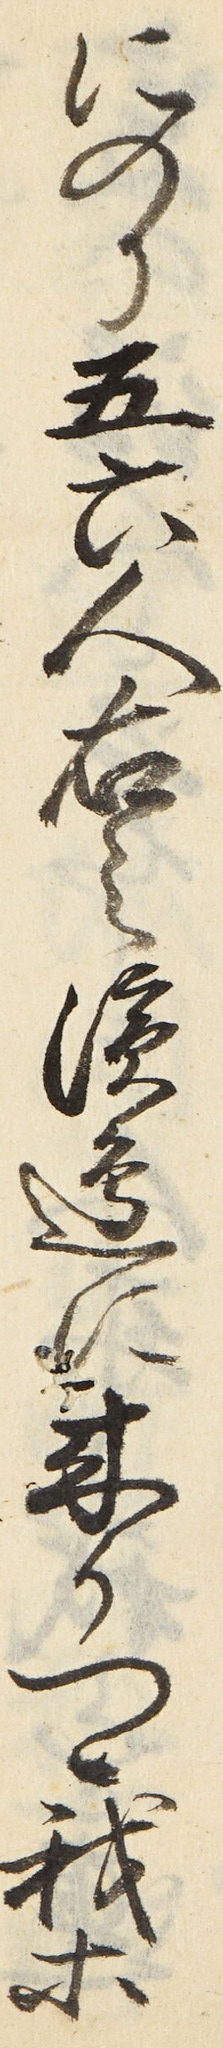にのり五六人右之浜辺に来りつゝ我等
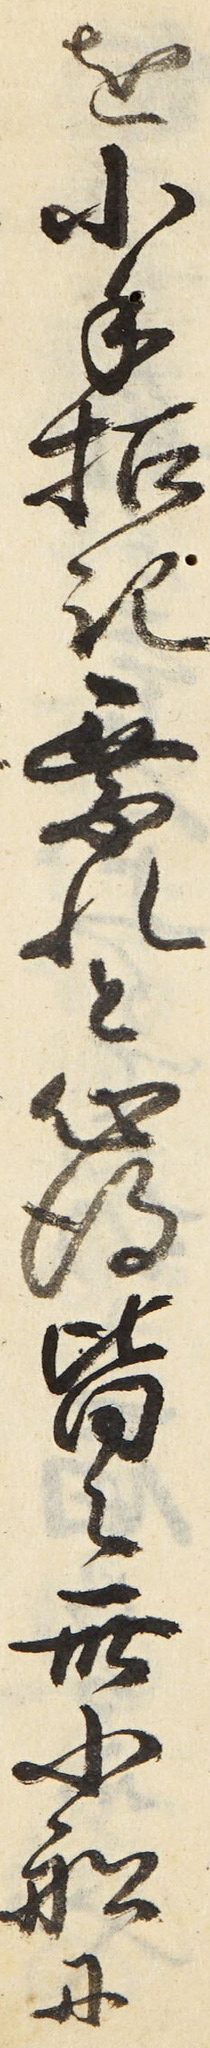を小手招き乗れと心得皆々此小船に
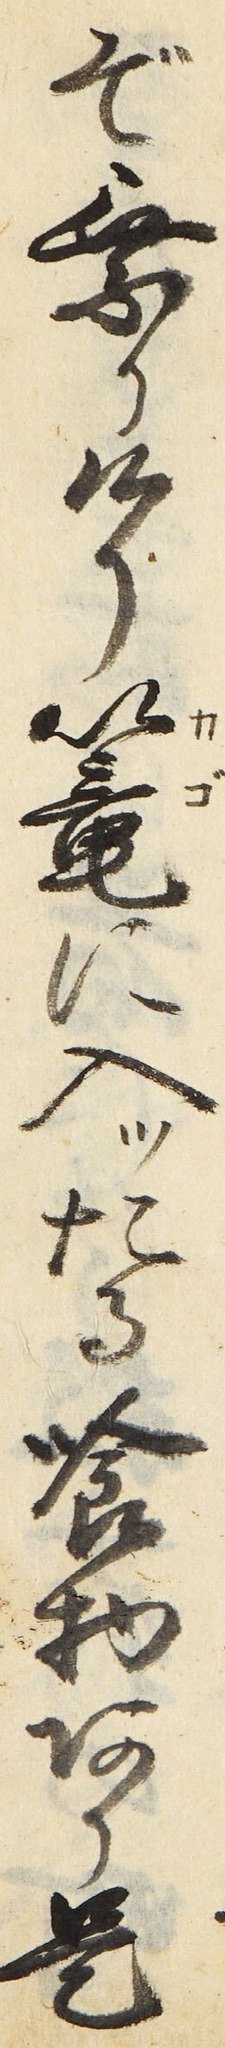ぞ乗りけり篭に入ッたる喰物あり是
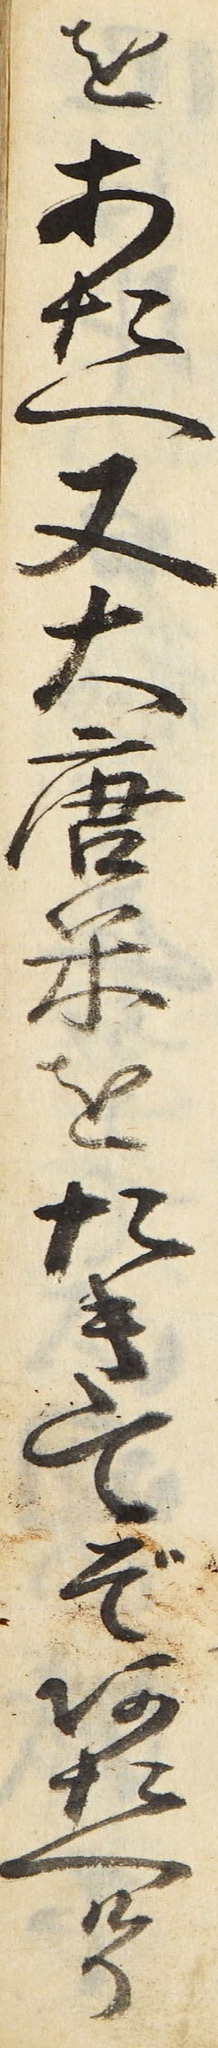をあたへ又大唐米をたきてぞあたへけり

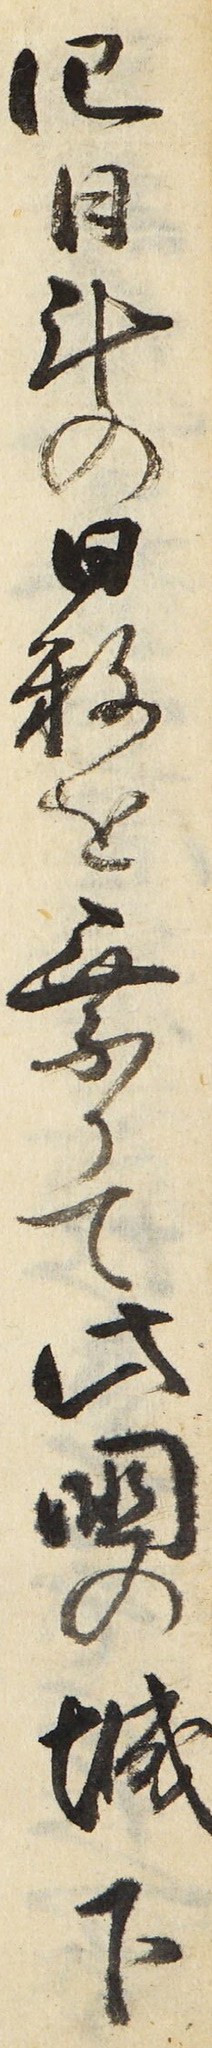四日計の日数を乗りて此国の城下
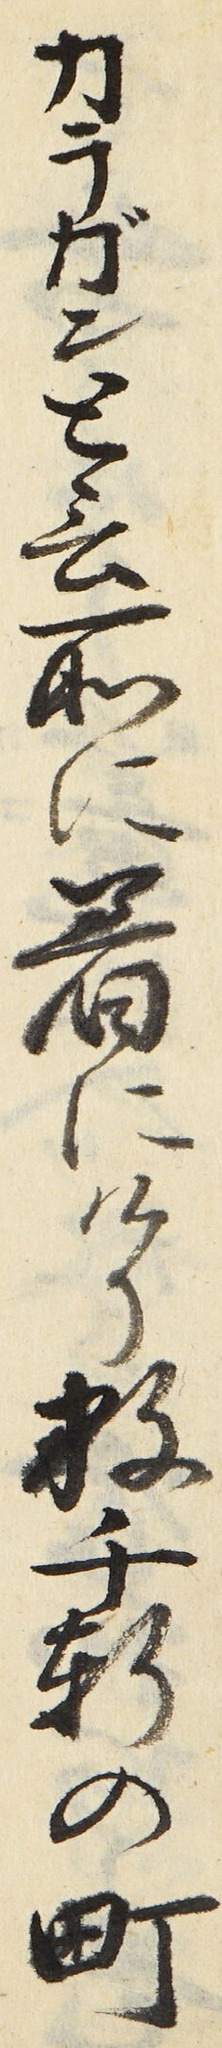カラガンと云所に着にけり数千軒の町
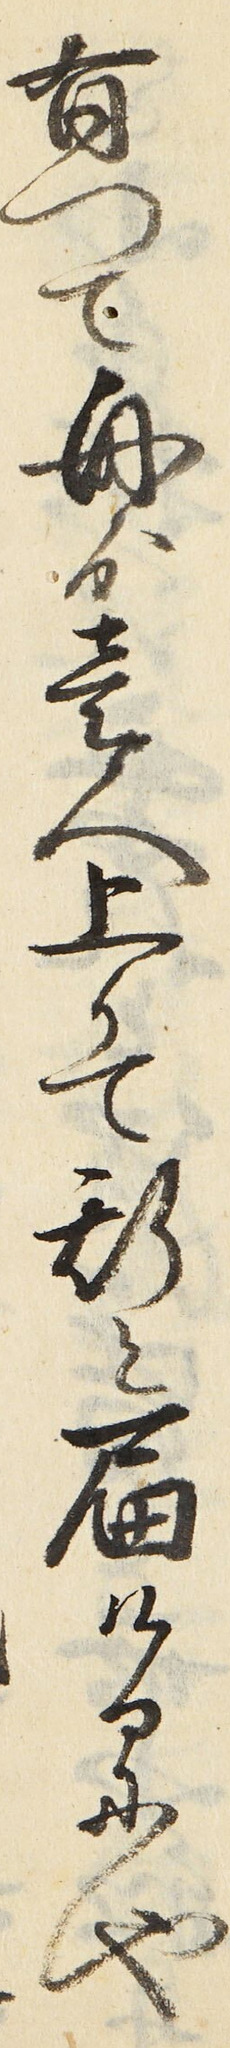有つて舟ゟ壱人上りて斯と届けるにや
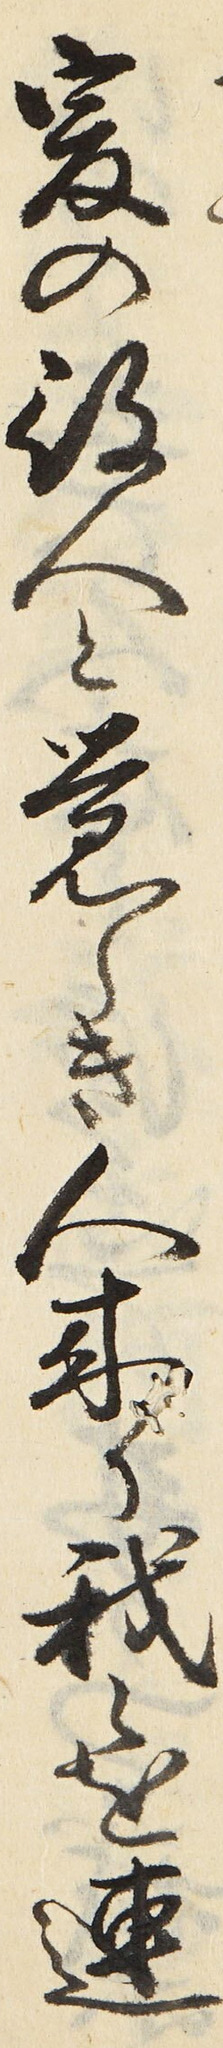爰の役人と覚しき人来り我々を連
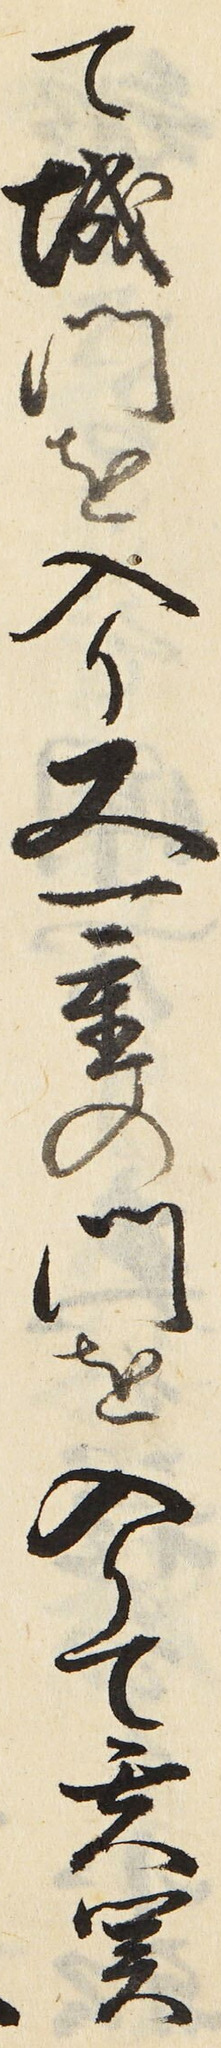て城門を入り又一重の門を入りて玄関
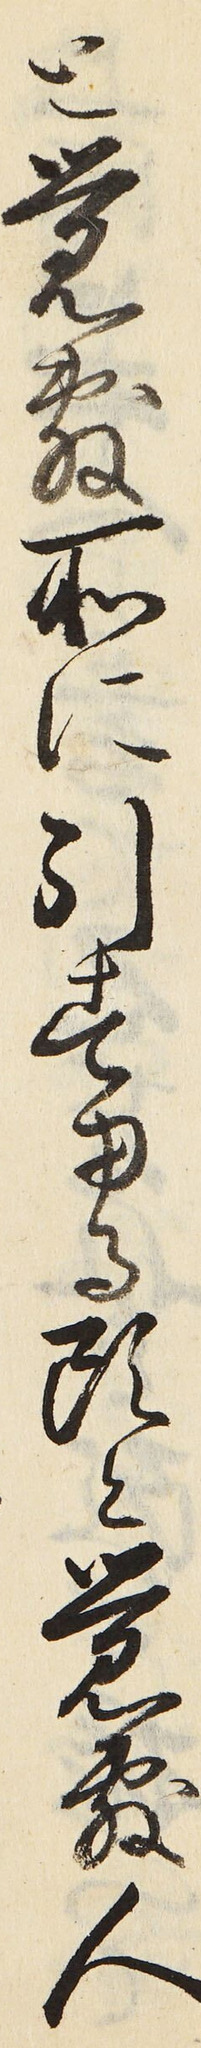と覚敷所に引すゆる頭と覚敷人
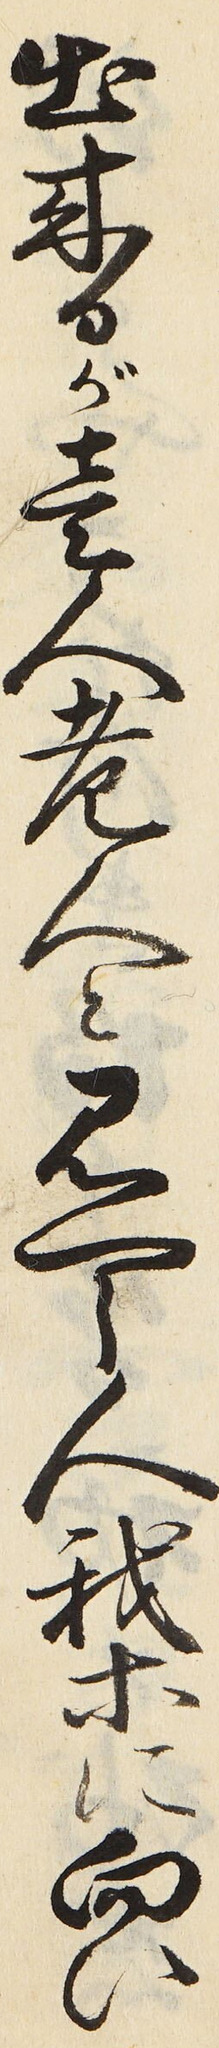出来るが壱人老人と見へし人我等に向ひ
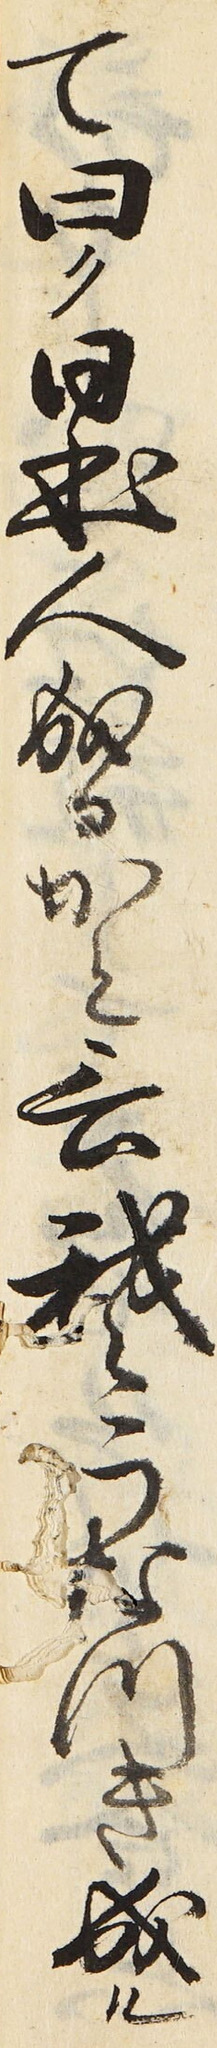て曰く日本人成るかと云我々うなづき成る
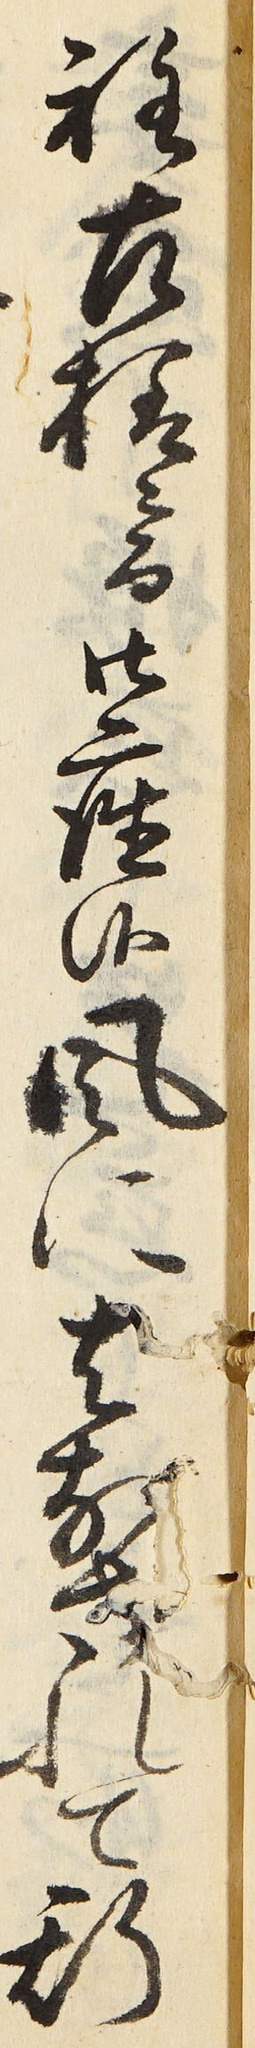程左様に而御座候風にはなされて斯
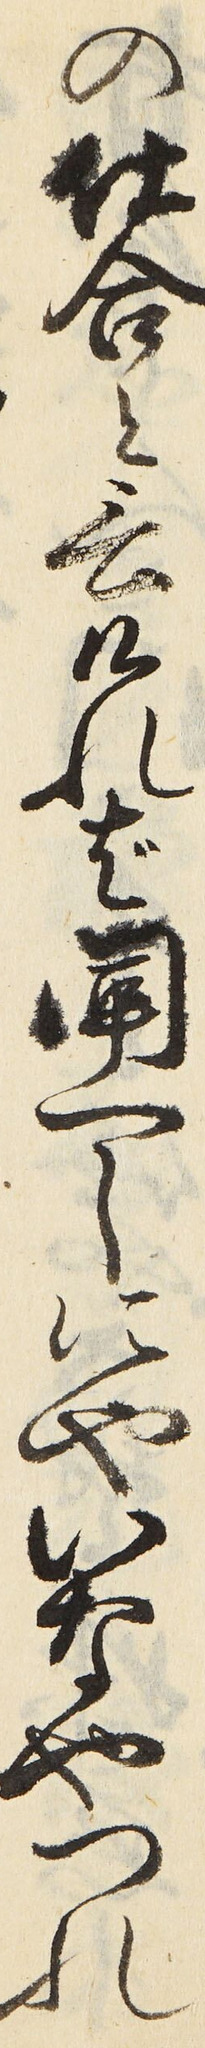の仕合と云ければ聞へしにやいなやつれ
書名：華夷九年録
